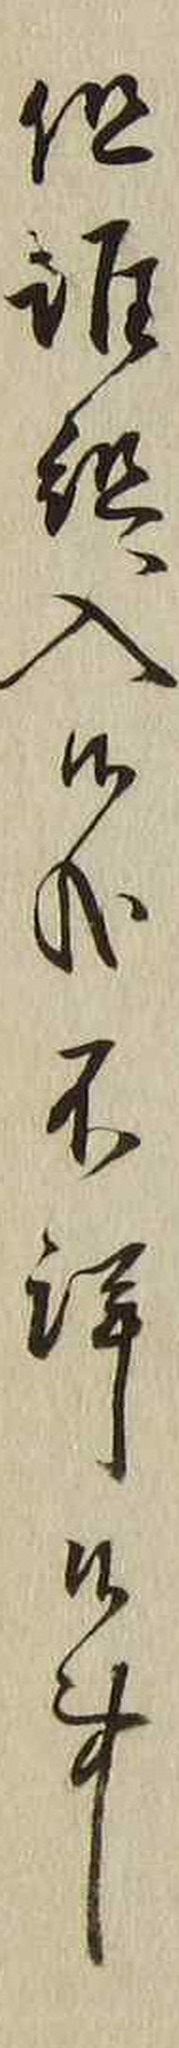但誰組へ入候哉不詳候事
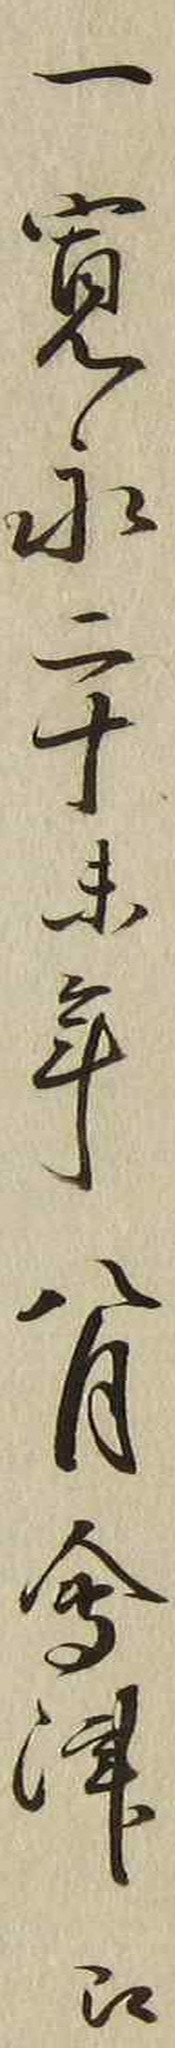一寛永二十未年八月会津被
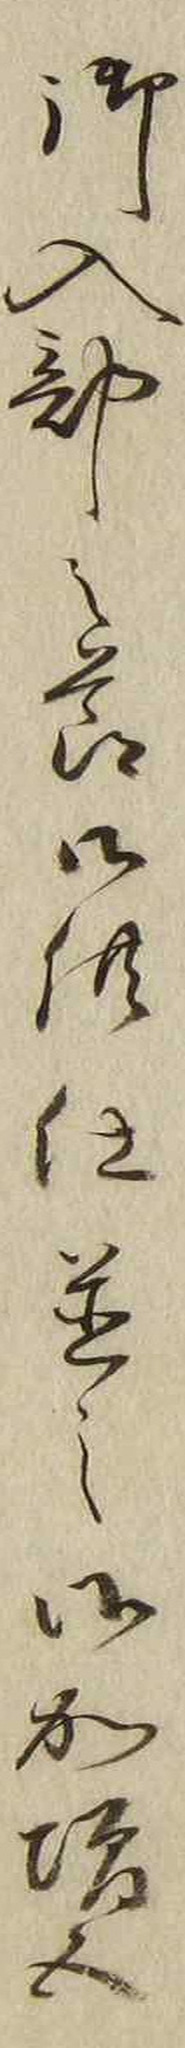御入部之節御供仕並之御加増五
